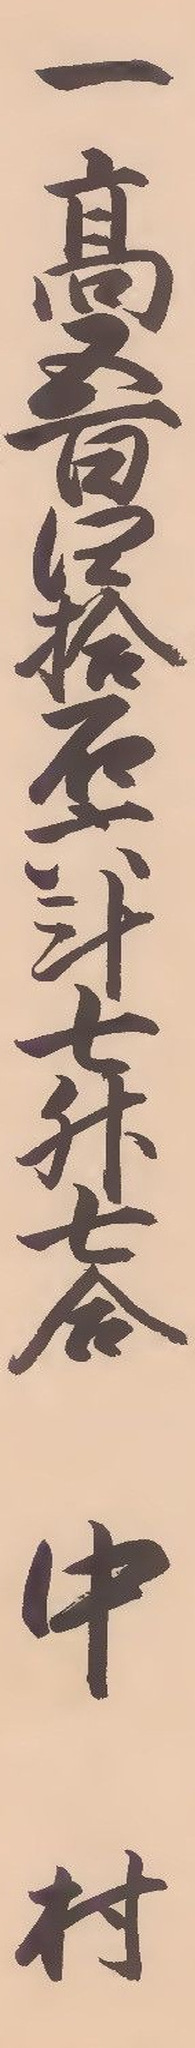一高五百四拾石六斗七升七合中村

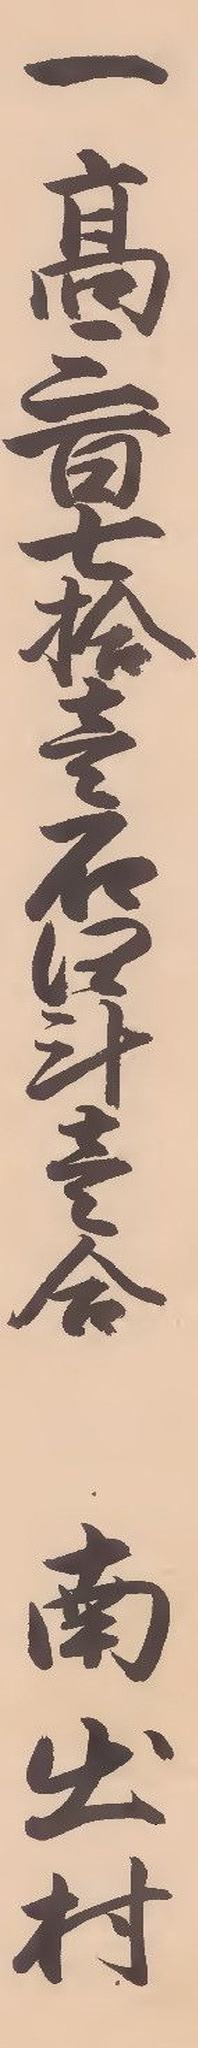一高三百七拾壱石四斗壱合南出村
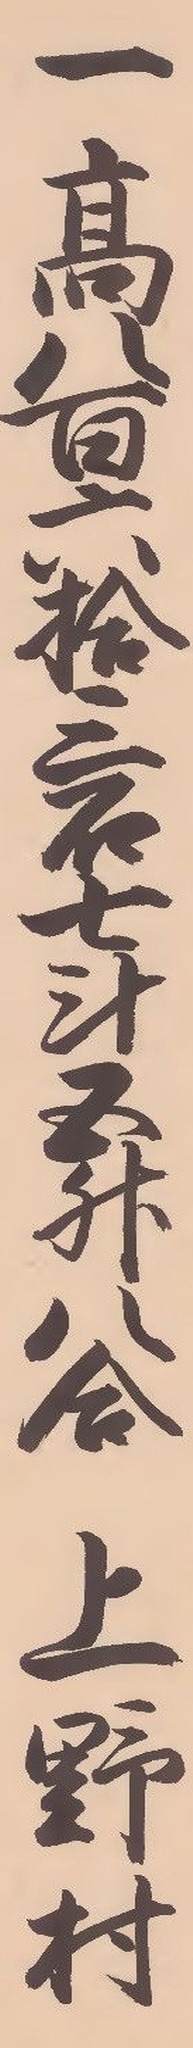一高八百六拾三石七斗五升八合上野村
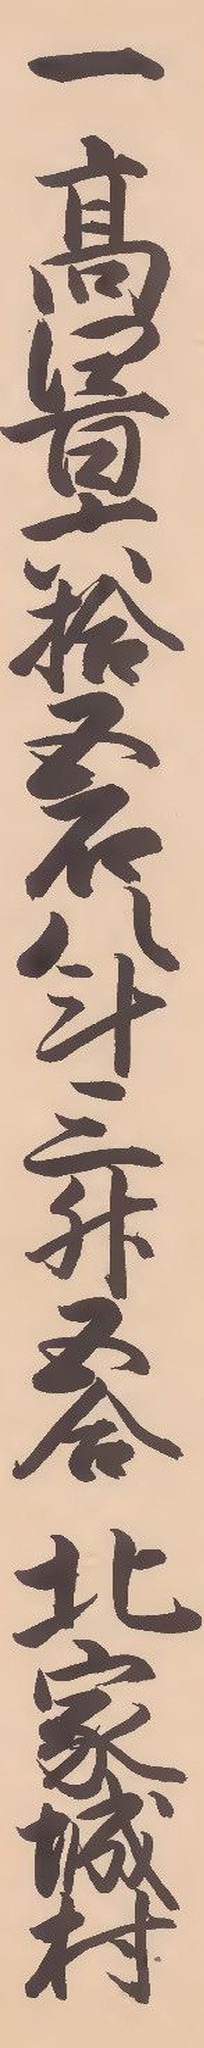一高四百六拾五石八斗三升五合北家城村
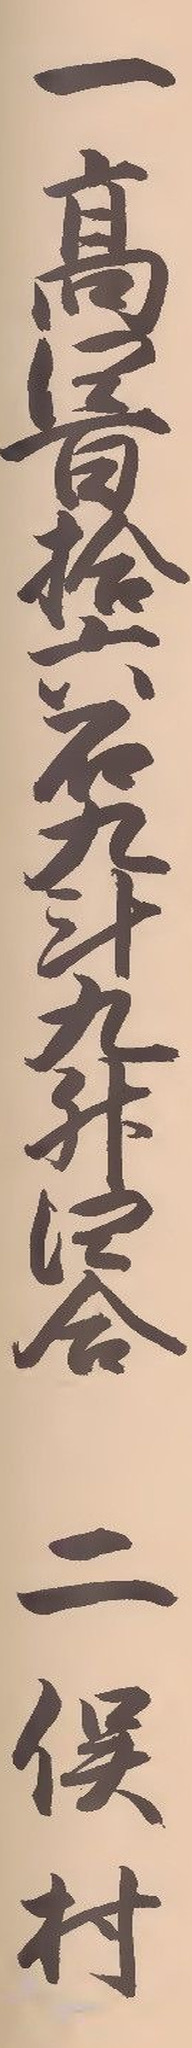一高四百拾六石九斗九升四合二俣村
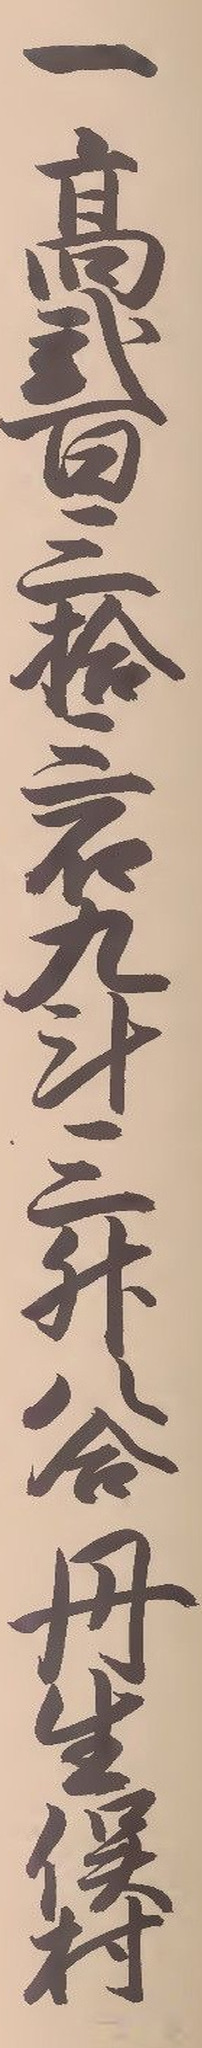一高弐百三拾三石九斗三升八合丹生俣村
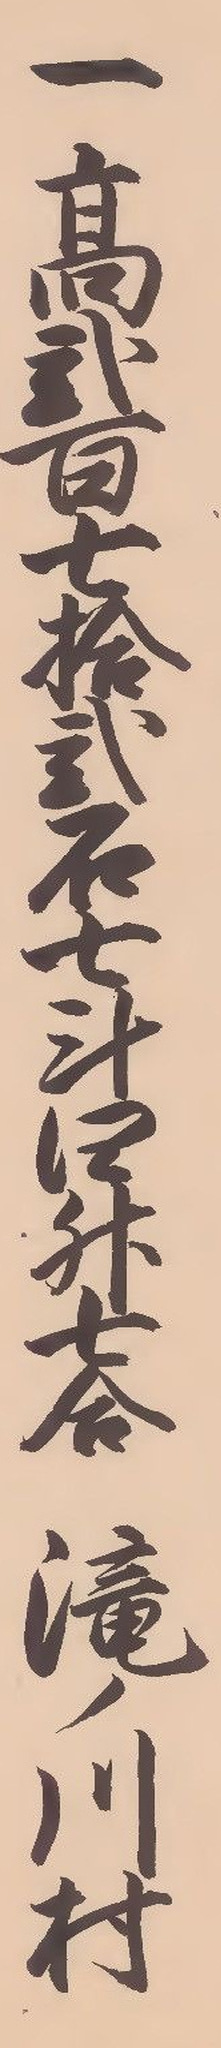一高弐百七拾弐石七斗四升七合滝ノ川村
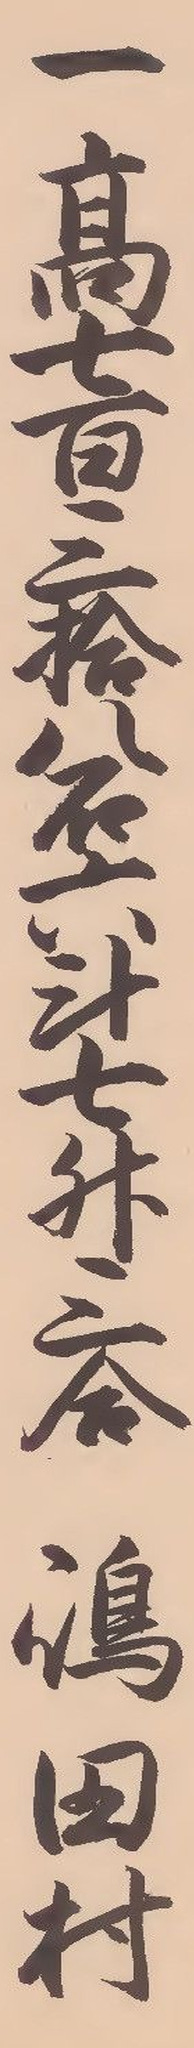一高七百三拾八石六斗七升三合嶋田村
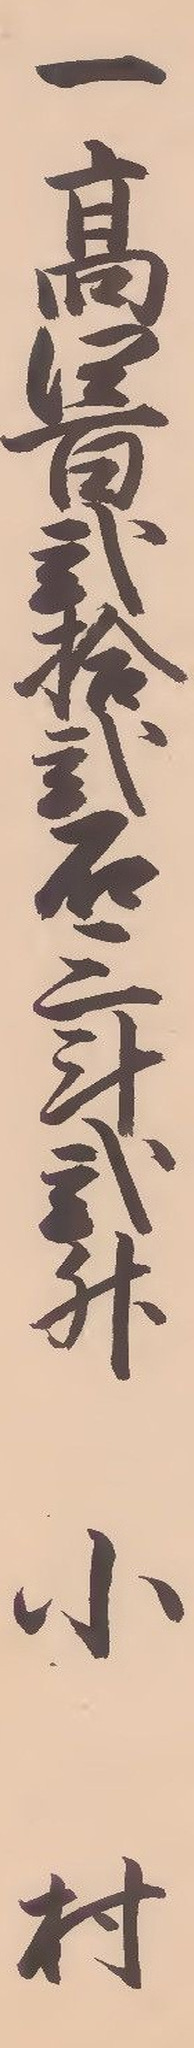一高四百弐拾弐石三斗弐升小村

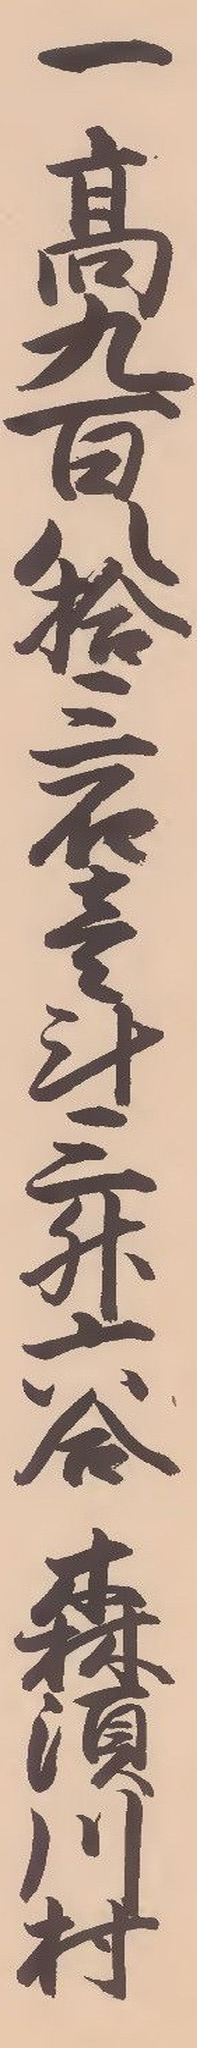一高九百八拾三石壱斗三升六合森須川村
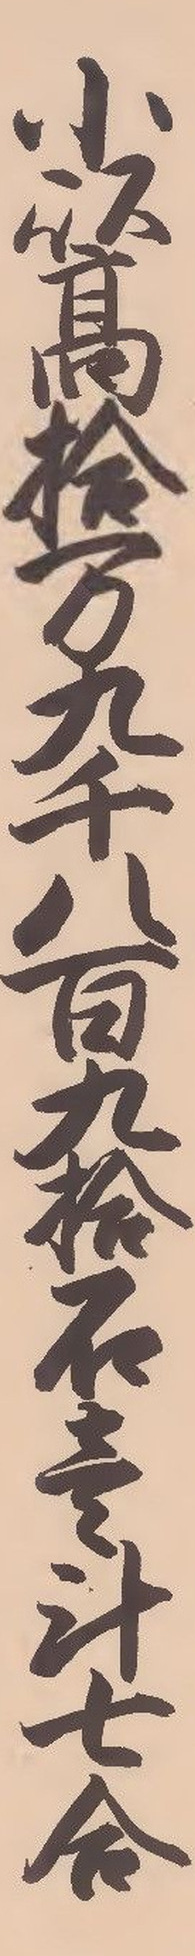小以高拾万九千八百九拾石壱斗七合
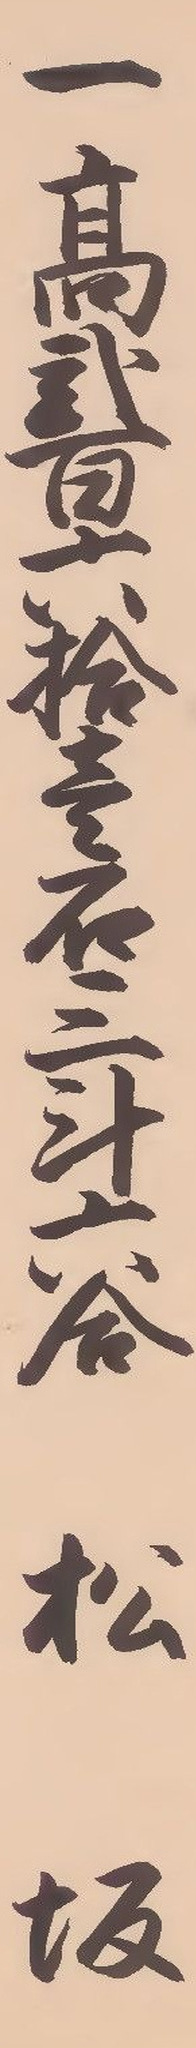一高弐百六拾壱石三斗六合松坂
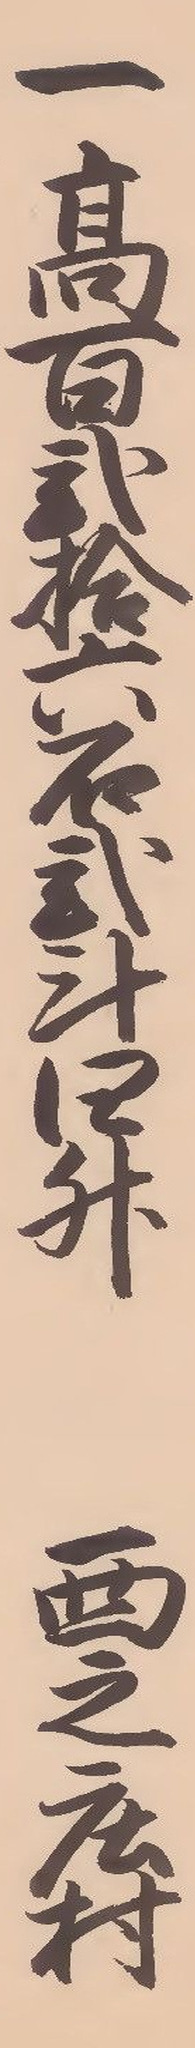一高百弐拾六石弐斗四升西之庄村
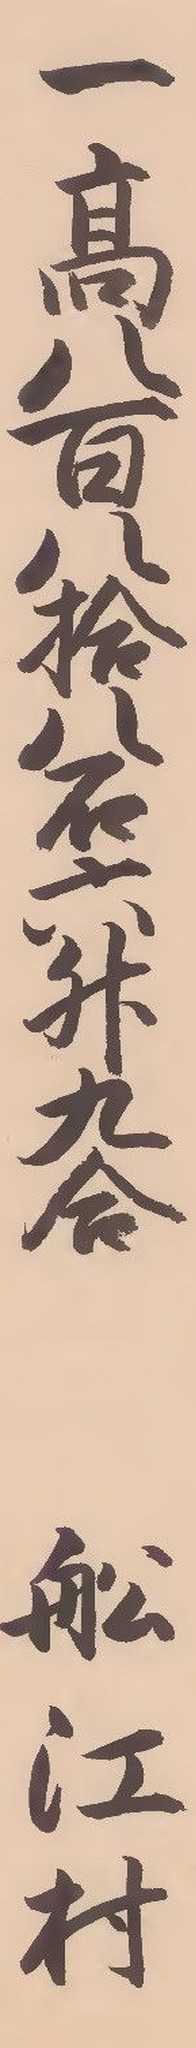一高八百八拾八石六升九合船江村

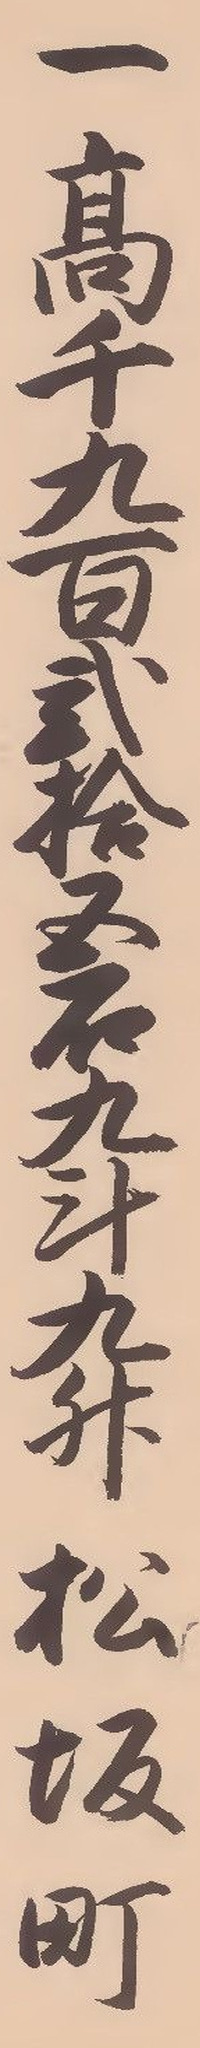一高千九百弐拾五石九斗九升松坂町
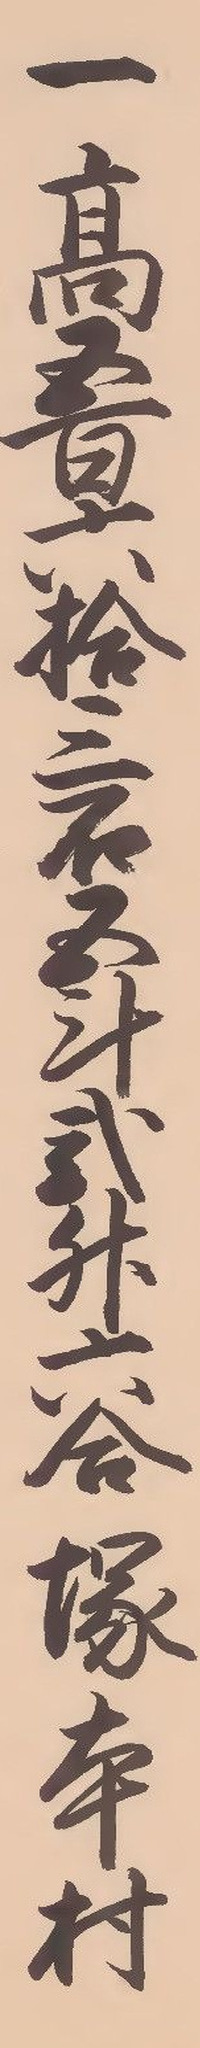一高五百六拾三石五斗弐升六合塚本村
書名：伊勢国郷帳
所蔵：国立公文書館 National Archives of Japan
